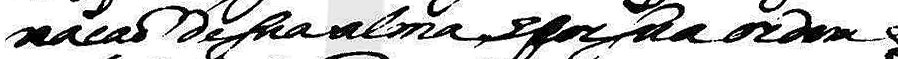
vaçaõ de sua alma, e por sua ordem e
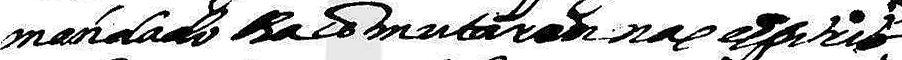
mandado lha cōmutaraõ nas espiri
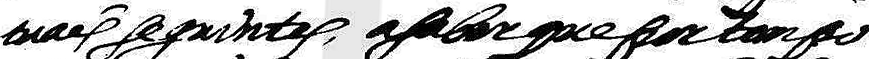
tuaes seguintes, a saber que por tempo
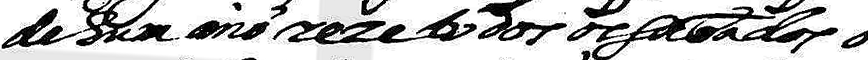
de hum ano reze todos os sabados o
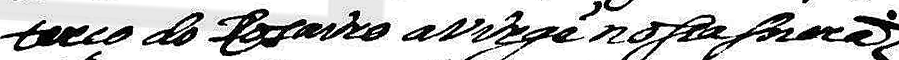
terço do Rosario a Virgẽ nossa Snor̄a
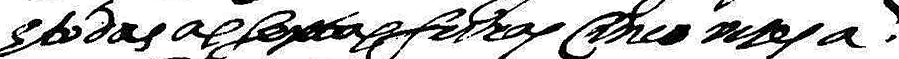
e todas as sextas feiras cinco veses a
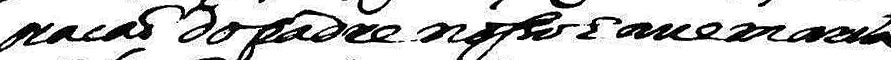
oraçaõ do padre nosso e aue maria
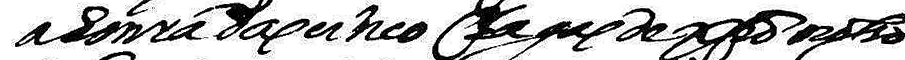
a honra das cinco Chagas de xpō nosso
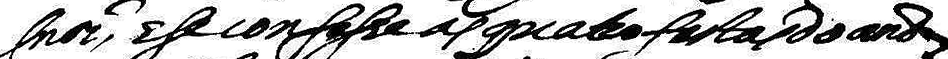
Snor̄, e se confesse as quatro festas do ano
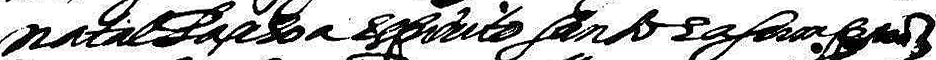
natal Paschoa Espīrito Santo e Assunpsaõ
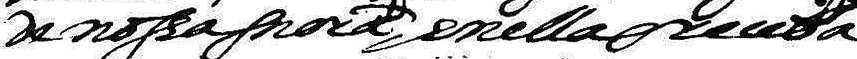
de nossa Snorā e nellas receba
